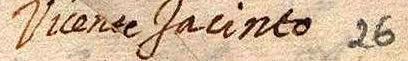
Vicente Jacinto
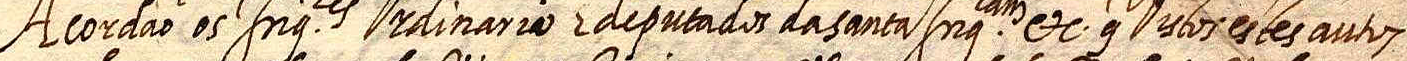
Acordão os Inq.res Ordinario E deputados da santa Inq.cam etc. q̄ Vistos estes autos
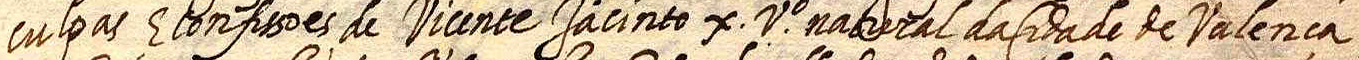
culpas E confissoes de Vicente Jacinto x. v.o natural da Cidade de Valença
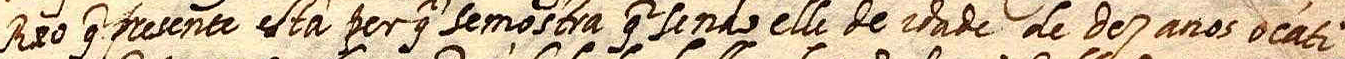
Reo q̄ presente està per q̄ se mostra q̄ sendo elle de idade de dez anos o cati
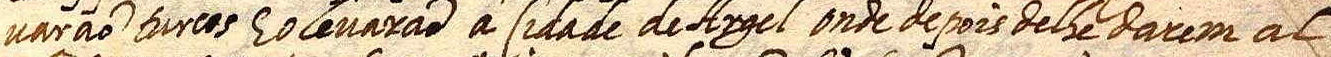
uaraõ turcos E o leuaraõ à Cidade de Argel onde depois de lhe darem al
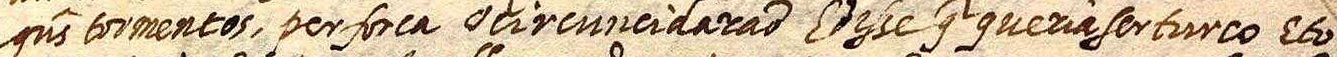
gūs tormentos, per força o circuncidaraõ E disse q̄ queria ser turco E to
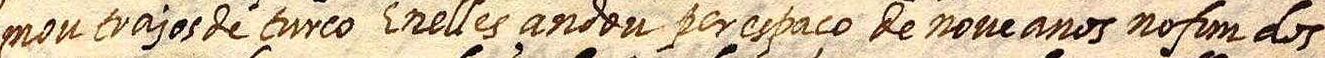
mou trajos de turco E nelles andou por espaço de noue anos no fim dos
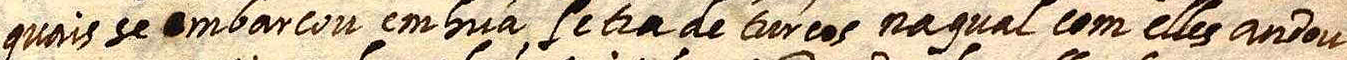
quais se embarcou em huā Setia de turcos na qual com elles andou
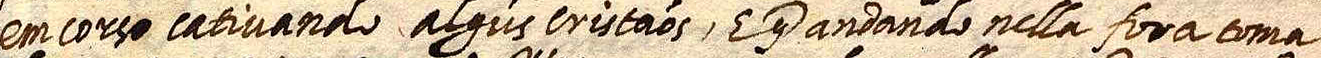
em corso catiuando algūs cristaõs, E q̄ andando nella fora toma
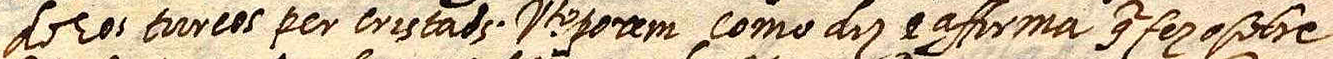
do E os turcos per cristaõs. V.to porem como diz e affirma q̄ fez o sobre
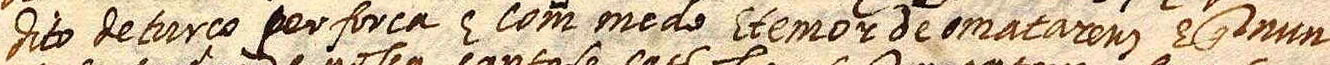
dito de turco per força e com medo E temor de o matarem E q̄ nun
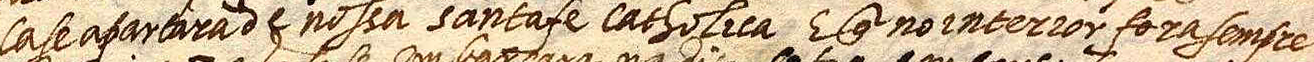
ca se apartara de nossa santa fe catholica e q̄ no interior fora sempre
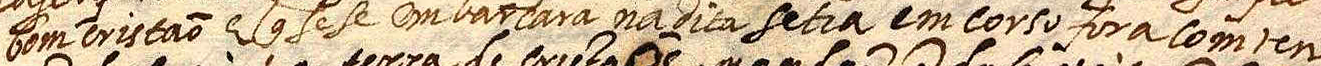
bom cristaõ E q̄ se se embarcara na dita setia em corso fora com ten
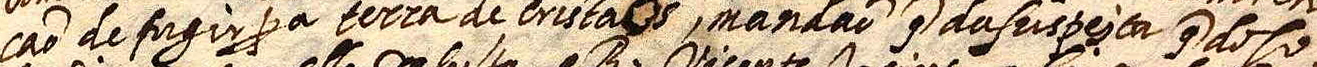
çaõ de fugir ꝑa terra de cristaõs, mandaõ q̄ da suspeita q̄ do So
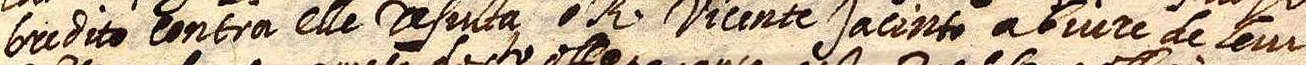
bredito contra elle resulta o R. Vicente Jacinto abiure de leui
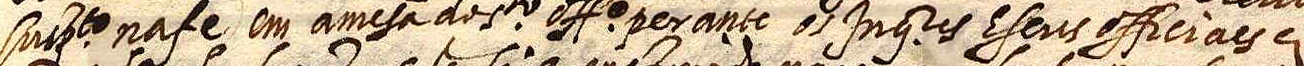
susp.to na fe em a mesa do s.to off.o perante os Inq.res E seus officiaes e
